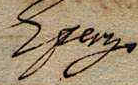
E pergo
